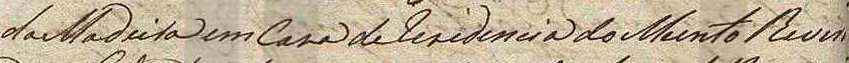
da Madeira em Caza de Rezidencia do Munto Rever
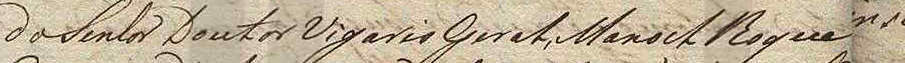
do Senhor Doutor Vigario Geral, Manoel Roque
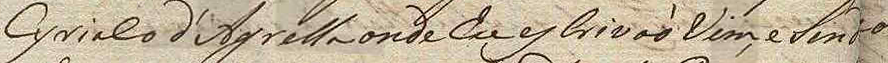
CyriaCo d'Agrella onde Eu esCrivaõ Vim, e Sen
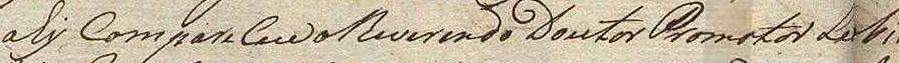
ahy CompareCeu o Reverendo Doutor Promotor Le
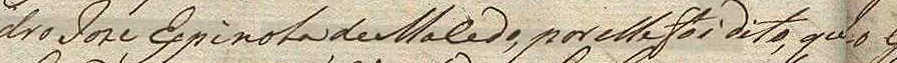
dro Ioze Espinola de MaCedo, por elle foi dito, qu
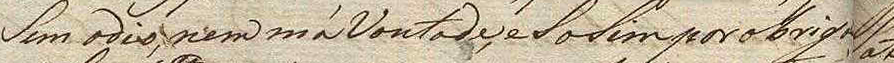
Sem odio, nem má Vontade, e So Sim por obrig
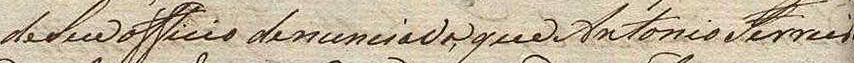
de Seu officio denunciava, que Antonio Ferreir
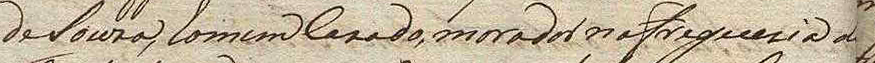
de Souza, homem Cazado, morador na freguezia d
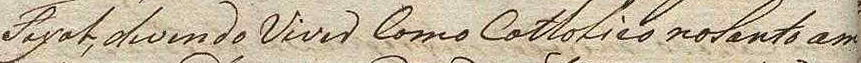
Fayal, devendo Viver como Catholico no Santo am
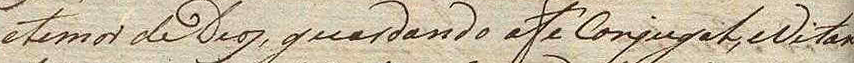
e temor de Deos, guardando a fe Conjugal, eVitan
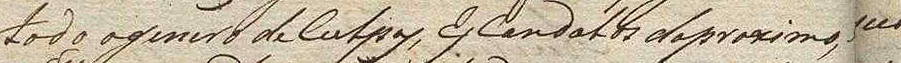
todo o genero de Culpas, EsCandalos do proximo,
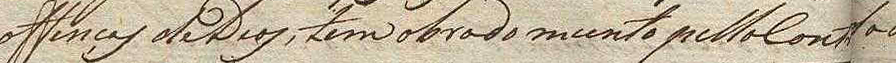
offenças de Deos, tem obrado munto pello Cont
